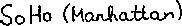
SoHo (Manhattan)
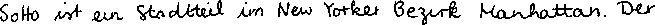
SoHo ist ein Stadtteil im New Yorker Bezirk Manhattan. Der
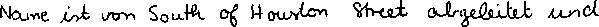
Name ist von South of Houston Street abgeleitet und
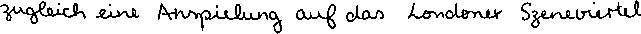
zugleich eine Anspielung auf das Londoner Szeneviertel
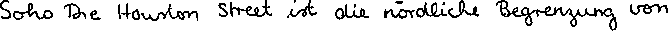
Soho. Die Houston Street ist die nördliche Begrenzung von
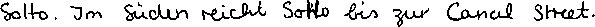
SoHo. Im Süden reicht SoHo bis zur Canal Street.
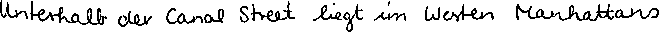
Unterhalb der Canal Street liegt im Westen Manhattans
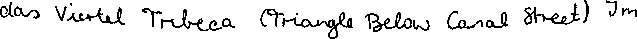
das Viertel Tribeca (Triangle Below Canal Street). Im
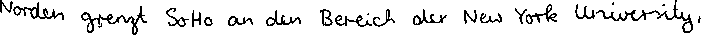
Norden grenzt SoHo an den Bereich der New York University,
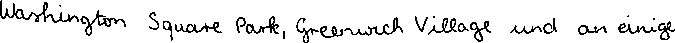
Washington Square Park, Greenwich Village und an einige
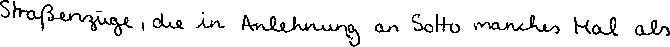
Straßenzüge, die in Anlehnung an SoHo manches Mal als
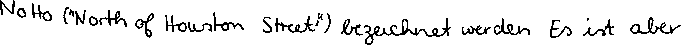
NoHo ("North of Houston Street") bezeichnet werden. Es ist aber
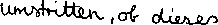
umstritten, ob dieses
